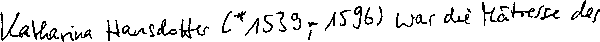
Katarina Hansdotter (* 1539; 1596) war die Mätresse des
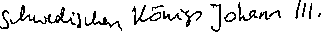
schwedischen Königs Johann III.
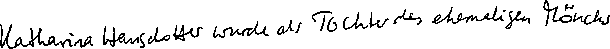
Katarina Hansdotter wurde als Tochter des ehemaligen Mönchs
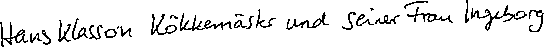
Hans Klasson Kökkemäster und seiner Frau Ingeborg
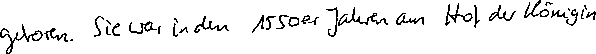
geboren. Sie war in den 1550er Jahren am Hof der Königin
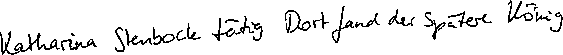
Katharina Stenbock tätig. Dort fand der spätere König
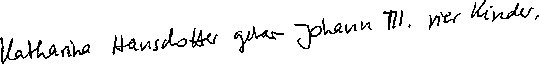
Katarina Hansdotter gebar Johann III. vier Kinder.
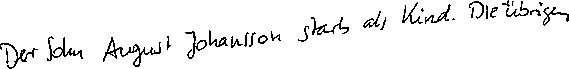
Der Sohn August Johansson starb als Kind. Die übrigen
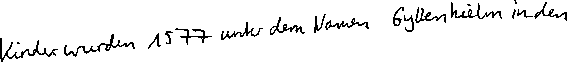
Kinder wurden 1577 unter dem Namen Gyllenhielm in den
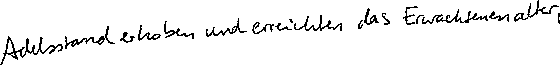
Adelsstand erhoben und erreichten das Erwachsenenalter,
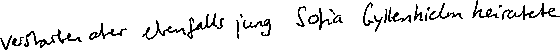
verstarben aber ebenfalls jung. Sofia Gyllenhielm heiratete
